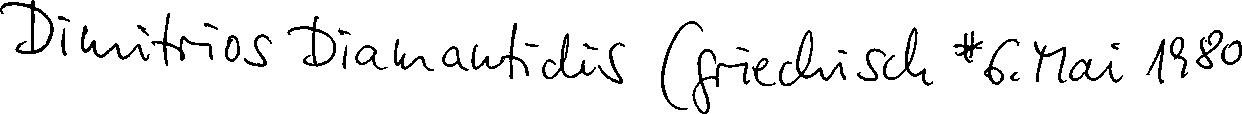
Dimitrios Diamantidis (griechisch * 6. Mai 1980
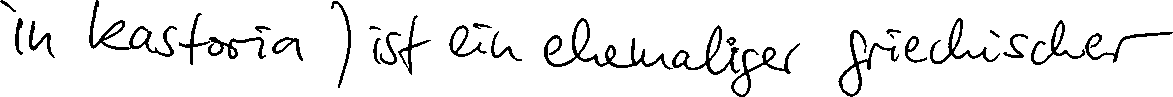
in Kastoria) ist ein ehemaliger griechischer
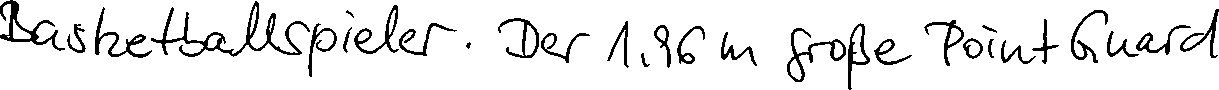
Basketballspieler. Der 1,96 m große Point Guard
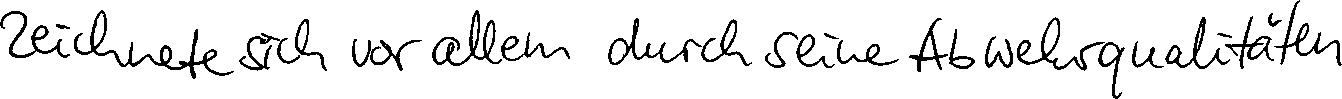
zeichnete sich vor allem durch seine Abwehrqualitäten
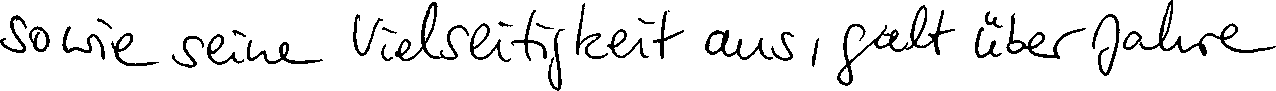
sowie seine Vielseitigkeit aus, galt über Jahre
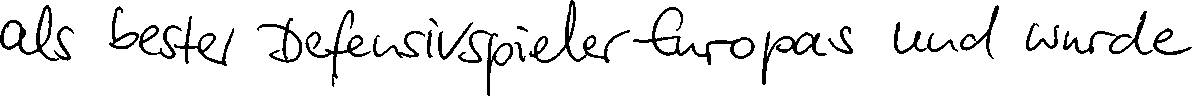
als bester Defensivspieler Europas und wurde
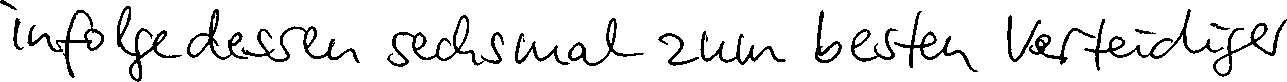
infolgedessen sechsmal zum besten Verteidiger
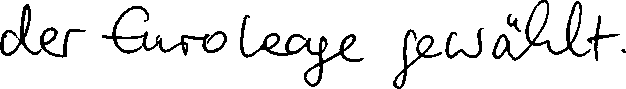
der EuroLeague gewählt.
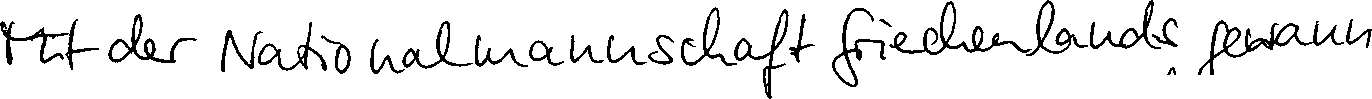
Mit der Nationalmannschaft Griechenlands gewann
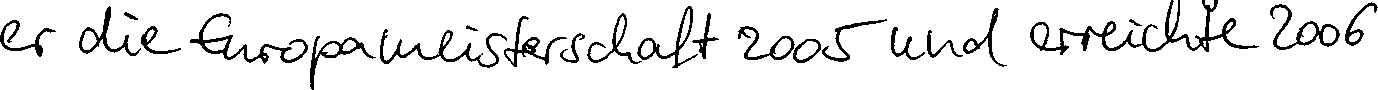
er die Europameisterschaft 2005 und erreichte 2006
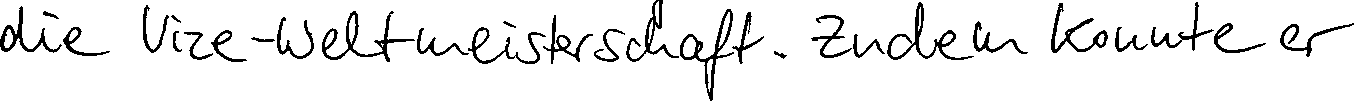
die Vize-Weltmeisterschaft. Zudem konnte er
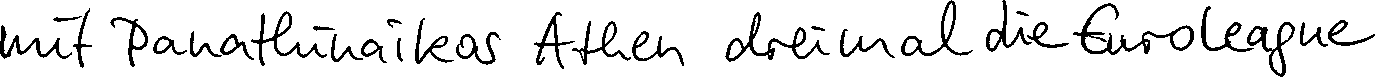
mit Panathinaikos Athen dreimal die EuroLeague
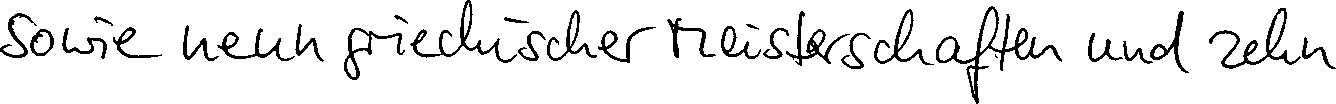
sowie neun griechischer Meisterschaften und zehn
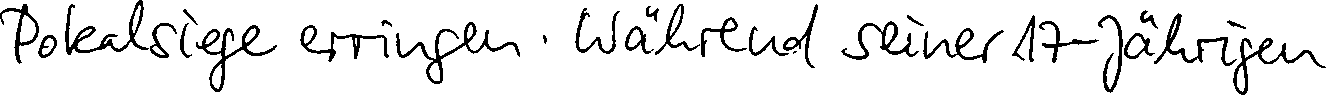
Pokalsiege erringen. Während seiner 17-Jährigen
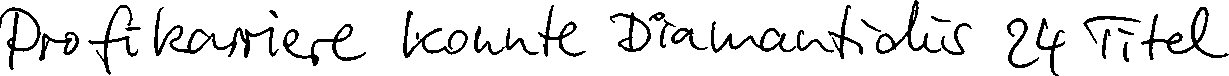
Profikarriere konnte Diamantidis 24 Titel
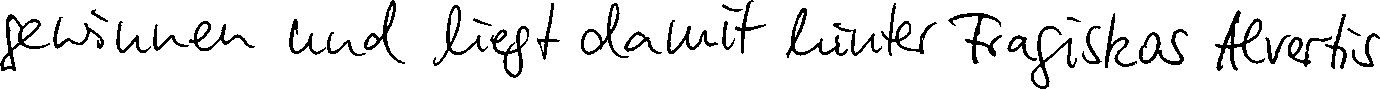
gewinnen und liegt damit hinter Fragiskos Alvertis
